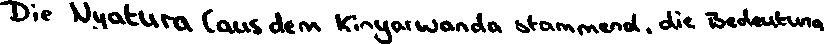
Die Nyatura (aus dem Kinyarwanda stammend, die Bedeutung
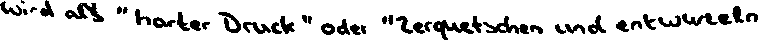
wird als "harter Druck" oder "Zerquetschen und entwurzeln
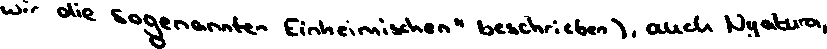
wir die sogenannten Einheimischen" beschrieben), auch Nyatura,
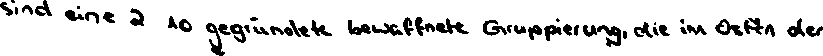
sind eine 2010 gegründete bewaffnete Gruppierung, die im Osten der
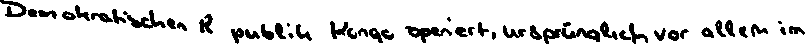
Demokratischen Republik Kongo operiert, ursprünglich vor allem im
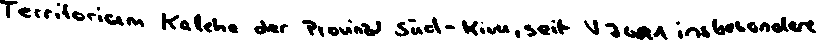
Territorium Kalehe der Provinz Süd-Kivu, seit 2011 insbesondere
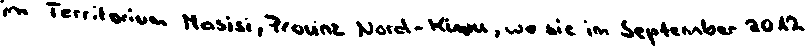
im Territorium Masisi, Provinz Nord-Kivu, wo sie im September 2012
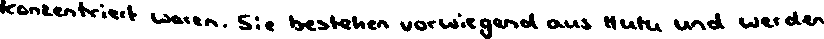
konzentriert waren. Sie bestehen vorwiegend aus Hutu und werden
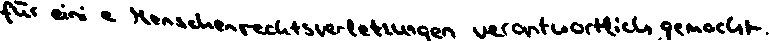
für einige Menschenrechtsverletzungen verantwortlich gemacht.
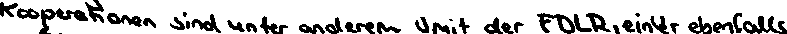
Kooperationen sind unter anderem mit der FDLR, einer ebenfalls
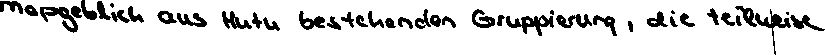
maßgeblich aus Hutu bestehenden Gruppierung, die teilweise
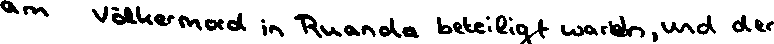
am Völkermord in Ruanda beteiligt waren, und der
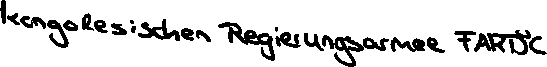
kongolesischen Regierungsarmee FARDC
